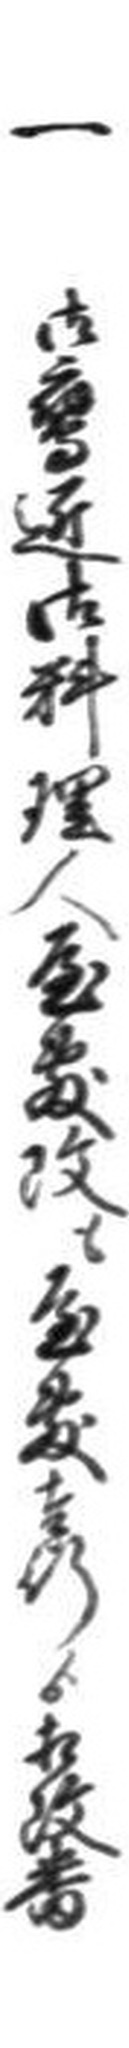一御鷹匠御料理人屋敷改も屋敷奉行ゟ相改番

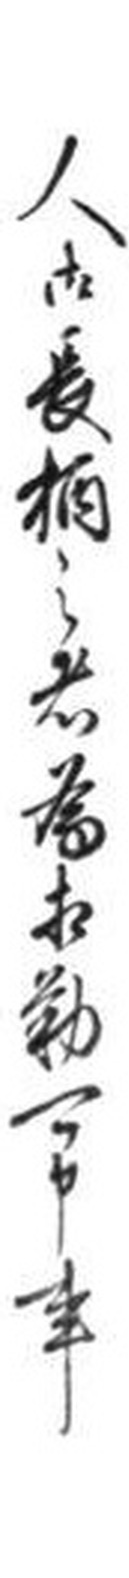人御長柄之者為相勤可申事
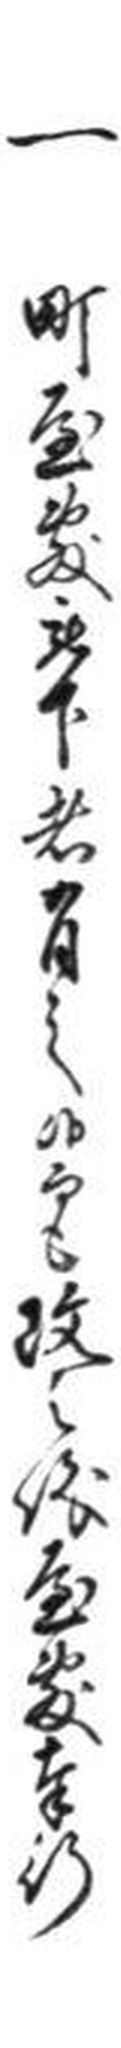一町屋敷被下者有之候而も改之儀屋敷奉行
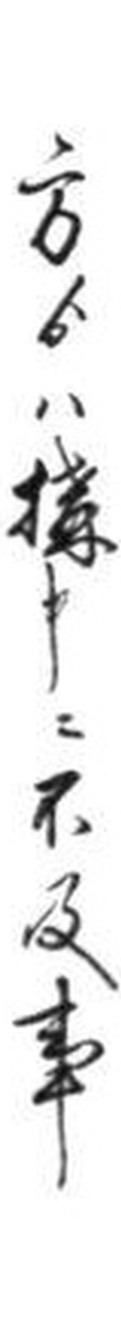方ゟハ構申ニ不及事
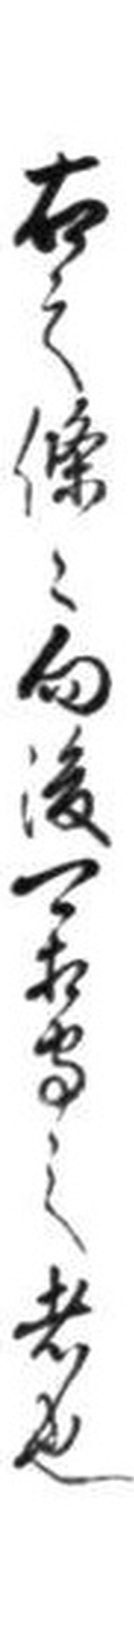右之条々向後可相守之者也
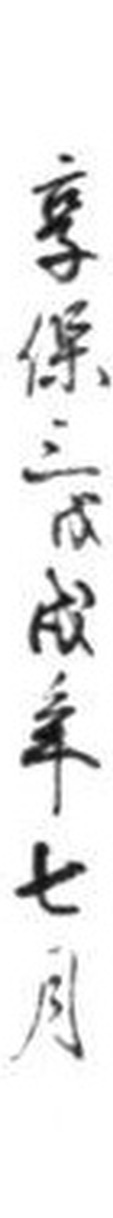享保三戊戌年七月
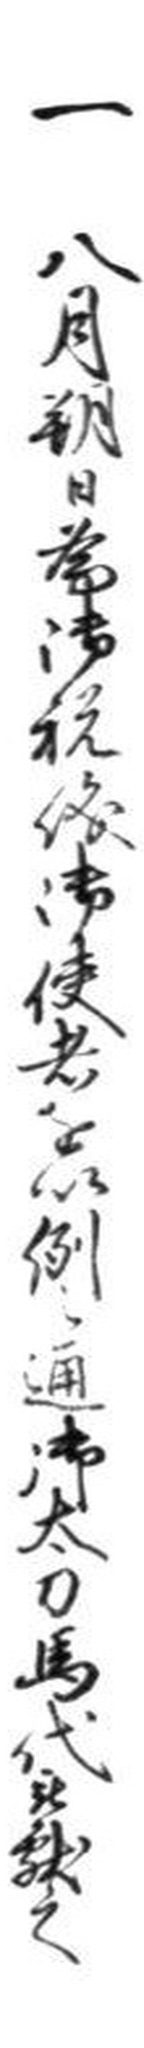一八月朔日為御祝儀御使者を以例之通御太刀馬代被献之
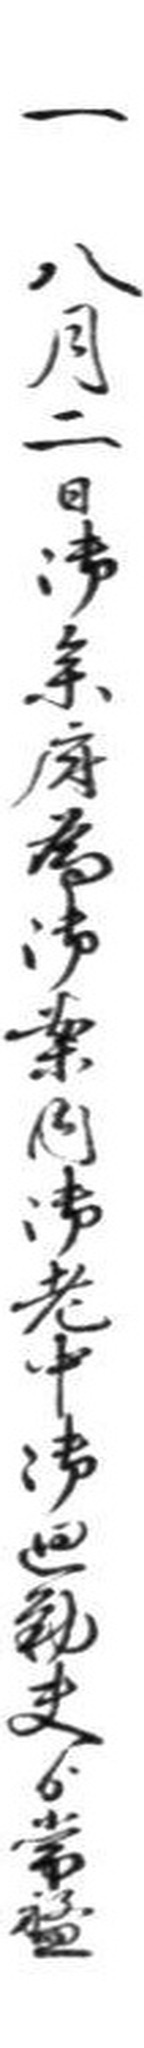一八月二日御参府為御案内御老中御廻勤夫ゟ常盤
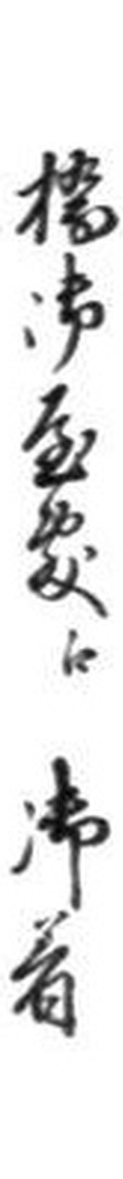橋御屋敷江御着
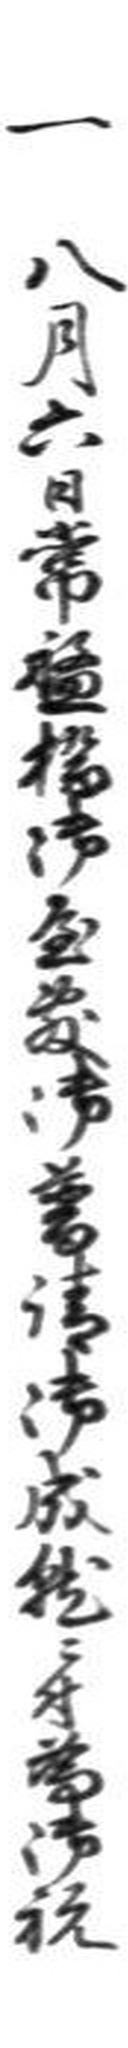一八月六日常盤橋御屋敷御普請御成就ニ付為御祝
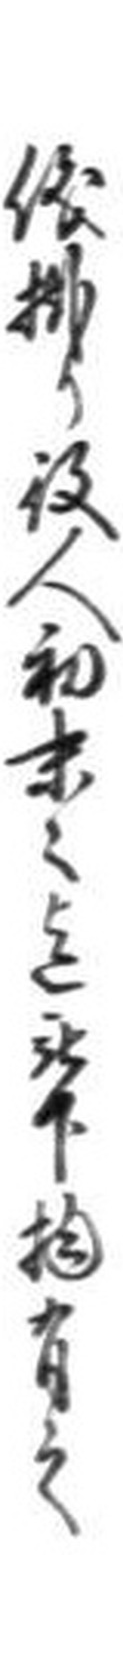儀掛り役人初末々迄被下物有之
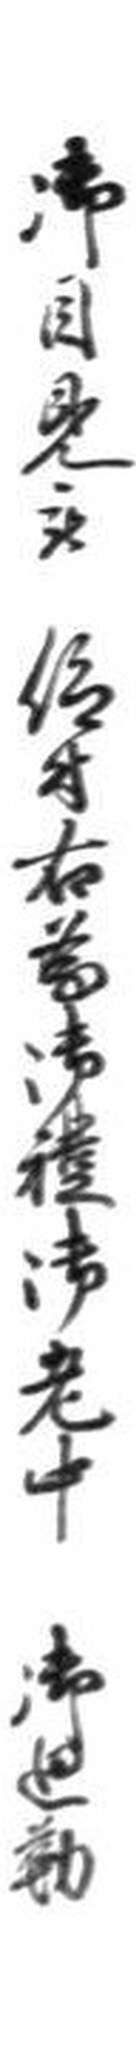御目見被仰付右為御礼御老中御廻勤

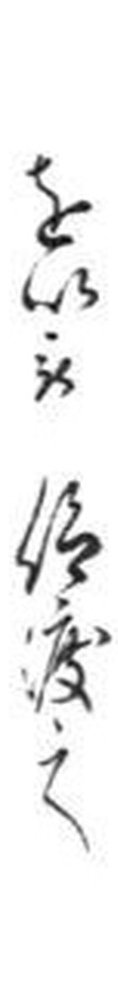を以被仰渡之
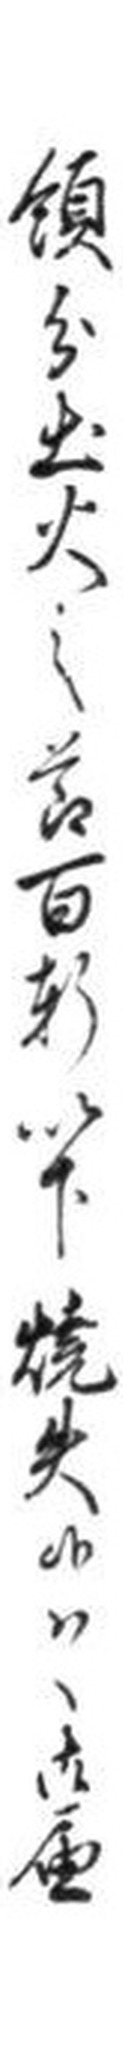領分出火之節百軒以下焼失候ハヽ御届
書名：家譜 三十二 吉邦公 従享保二年到享保三年
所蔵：福井県文書館 Fukui Prefectural Archives
